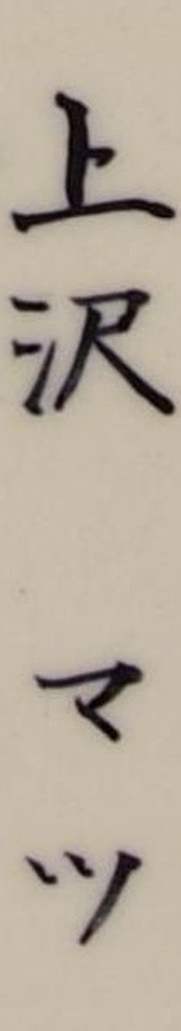上沢マツ
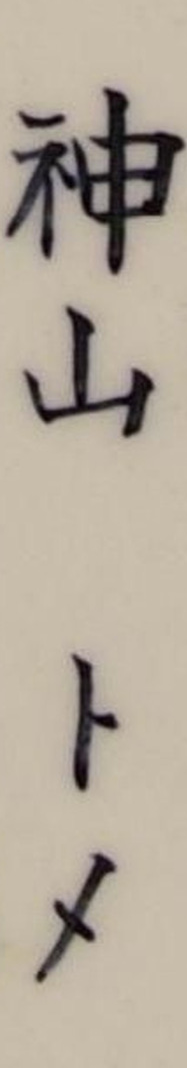神山トメ
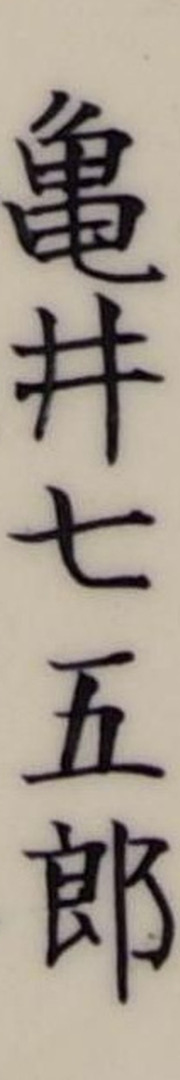亀井七五郎
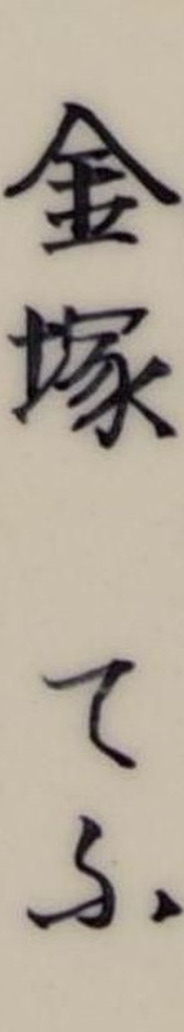金塚てふ
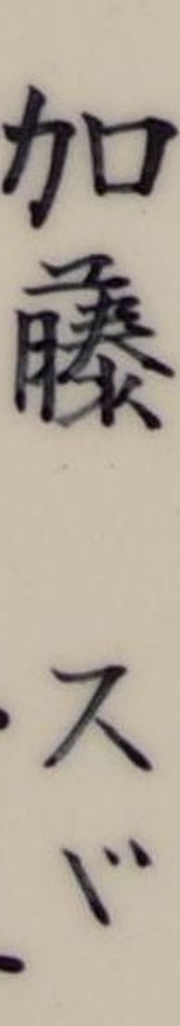加藤スゞ
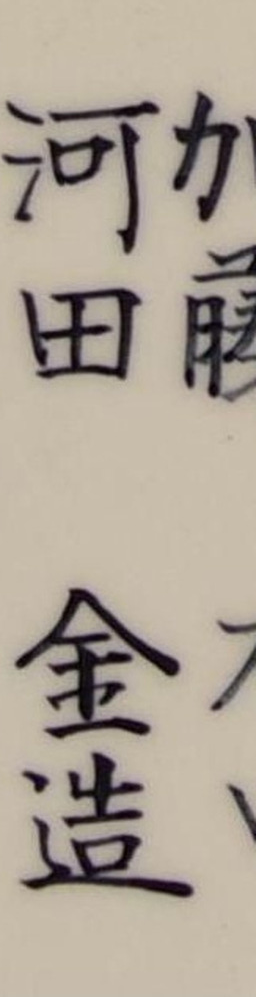河田金造
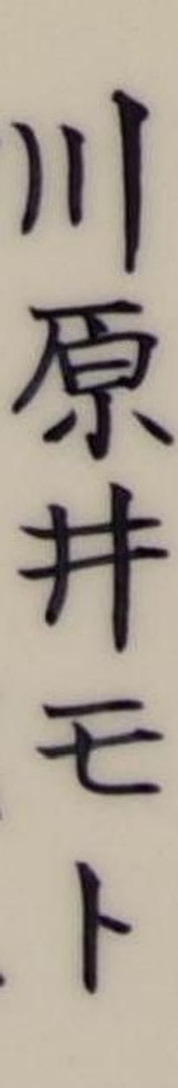川原井モト
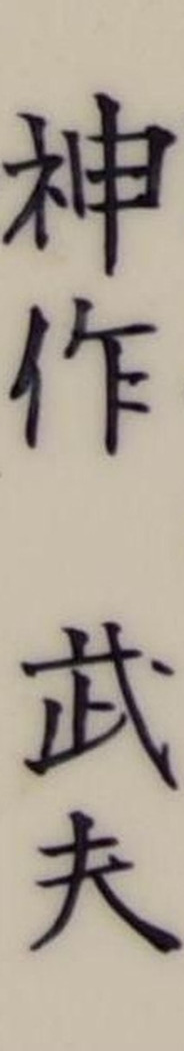神作武夫
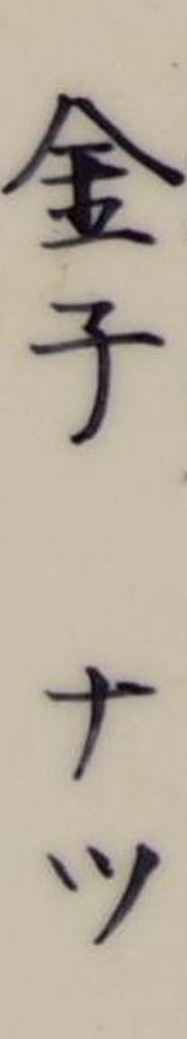金子ナツ
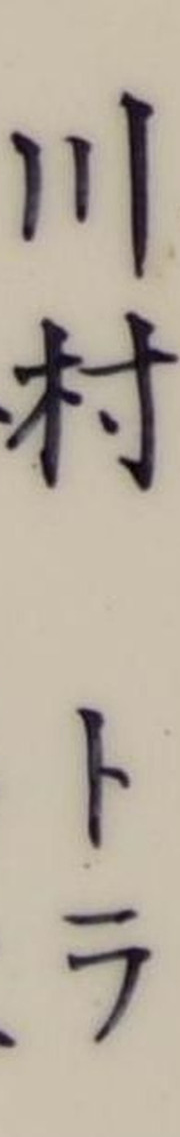川村トラ
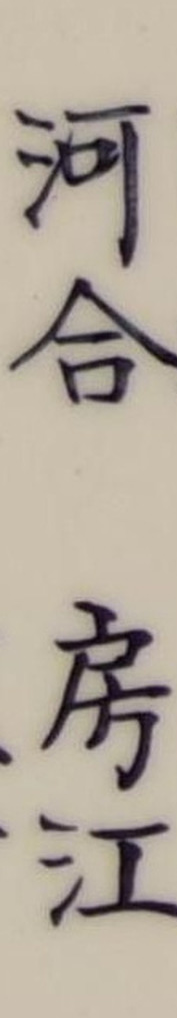河合房江

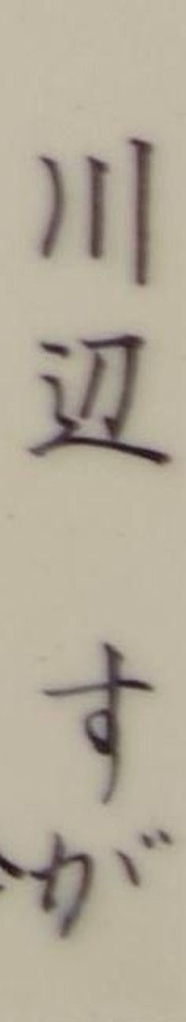川辺すが
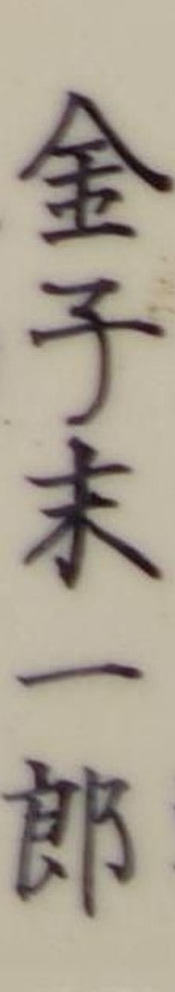金子末一郎
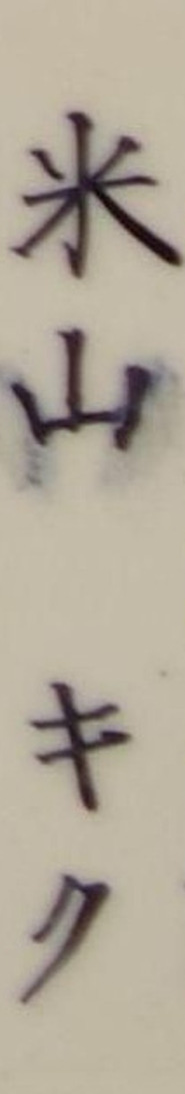米山キク
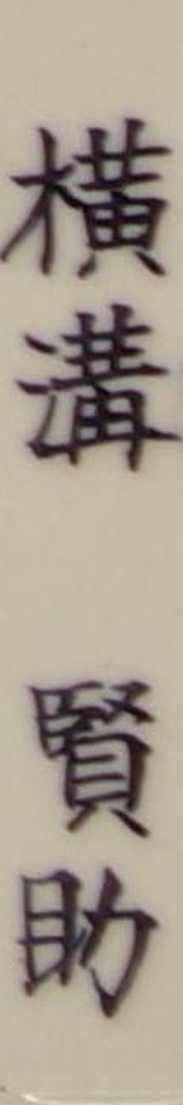横溝賢助
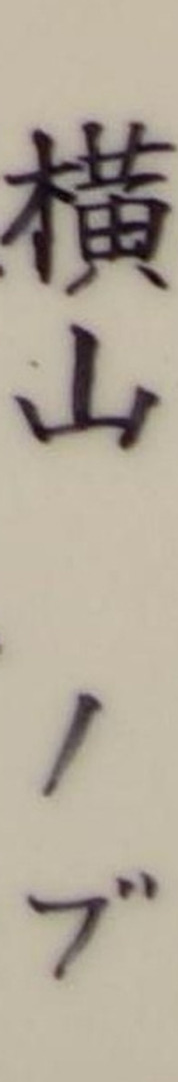横山ノブ
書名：M~S
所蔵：高野山金剛峯寺
